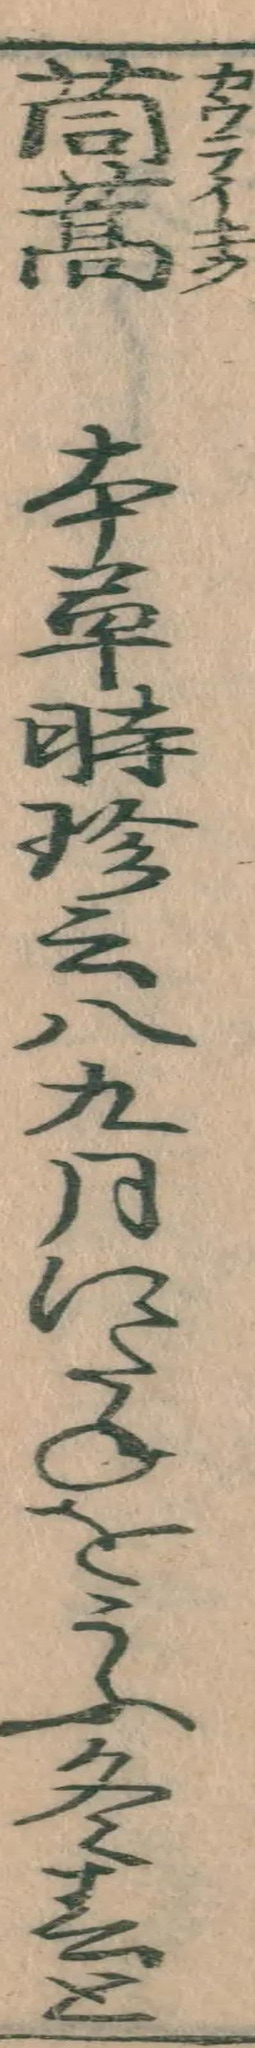茼蒿本草時珍云八九月にたねをうふ冬春と
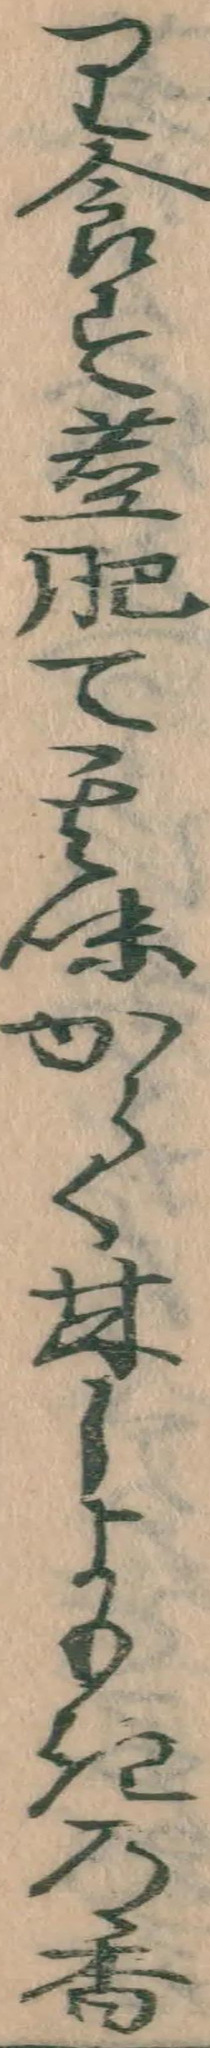り食す茎肥て其味からく甘しよもきの香
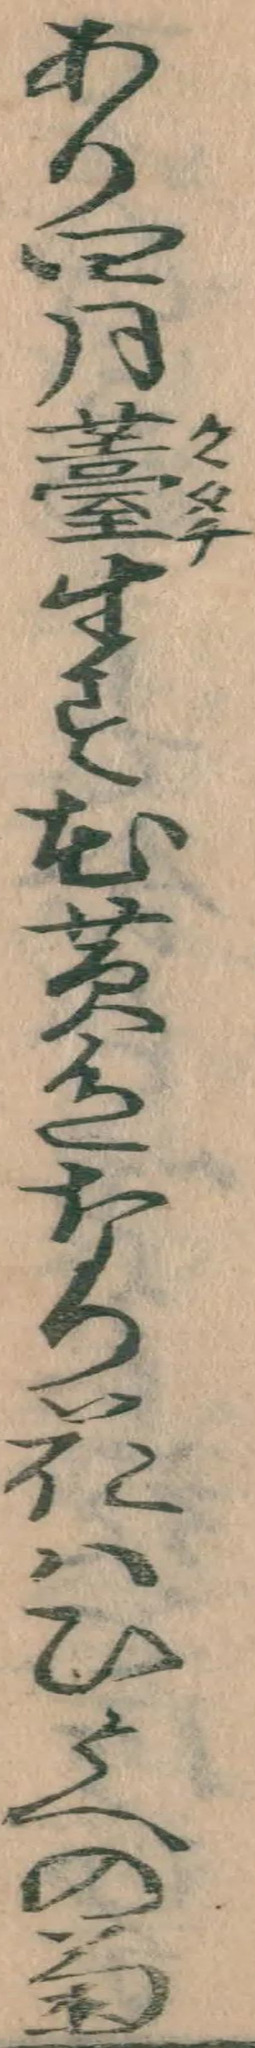あり四月薹生す花黄色なり花はひとへの菊
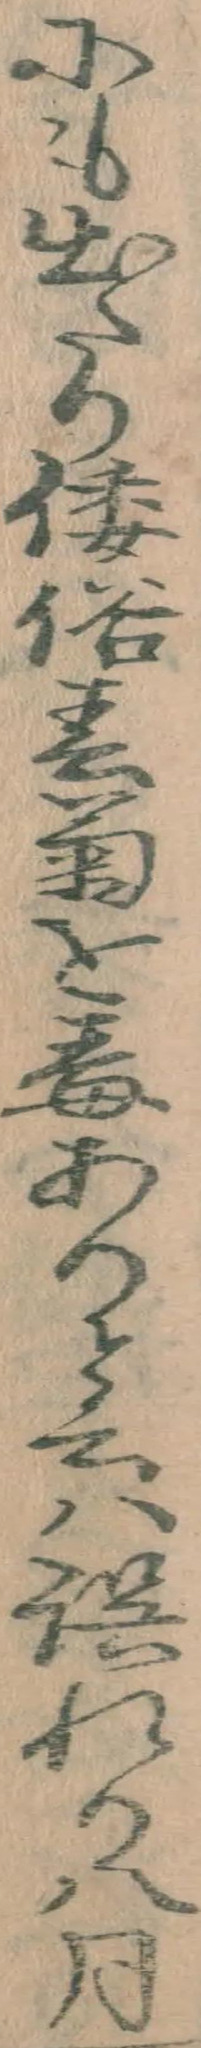にも出たり倭俗春菊を毒ありと云は誤れり八月
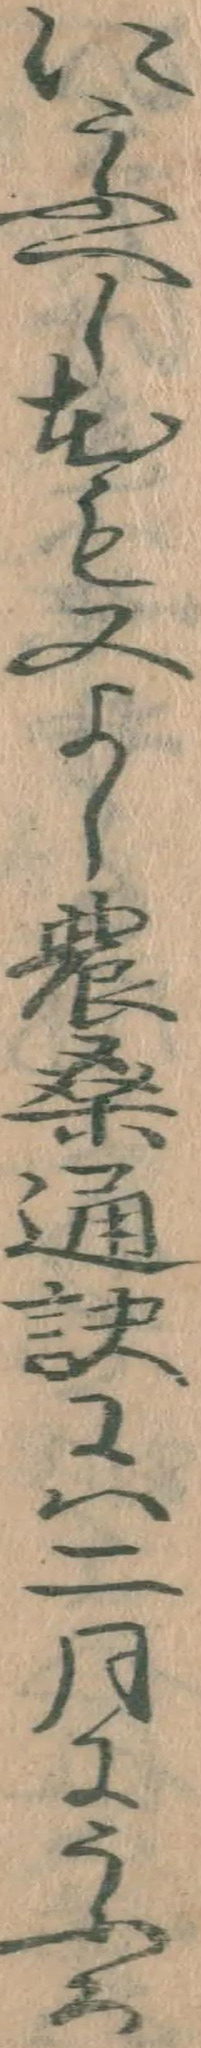にうふへし花も又よし農桑通訣には二月にうふる
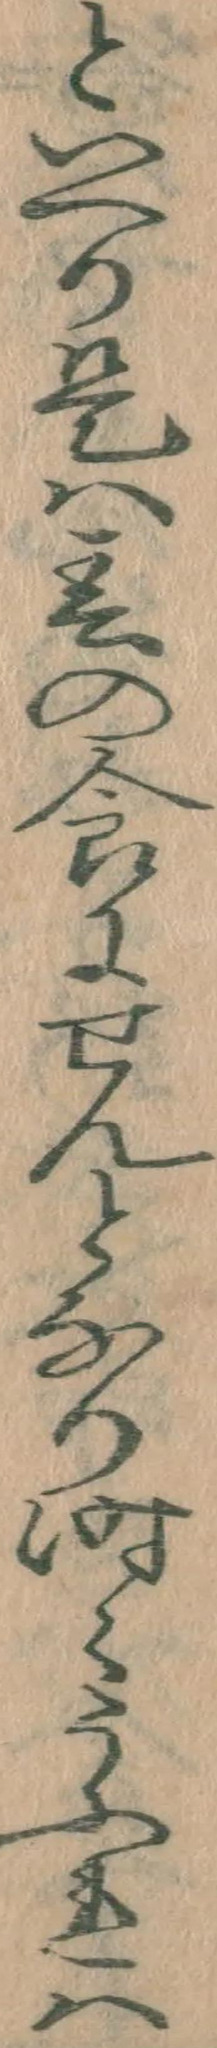といへり是は春の食にせんとなり時々うふれは
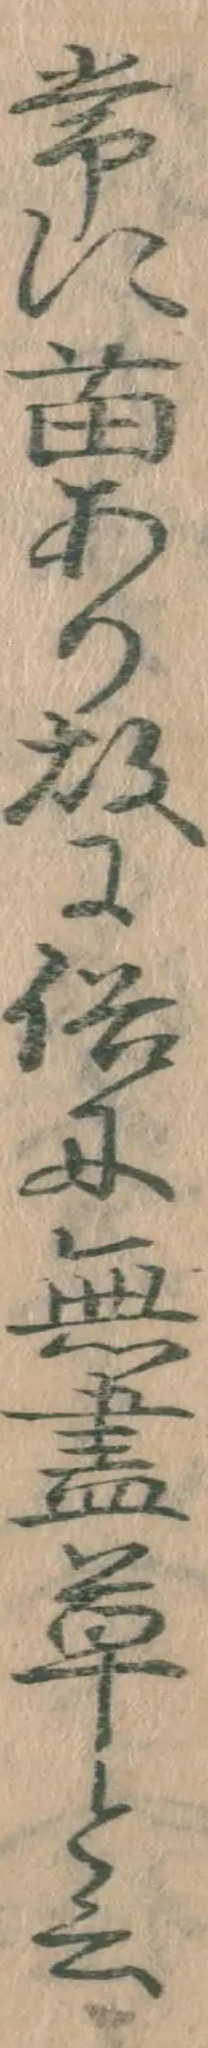常に苗あり故に俗に無尽草と云
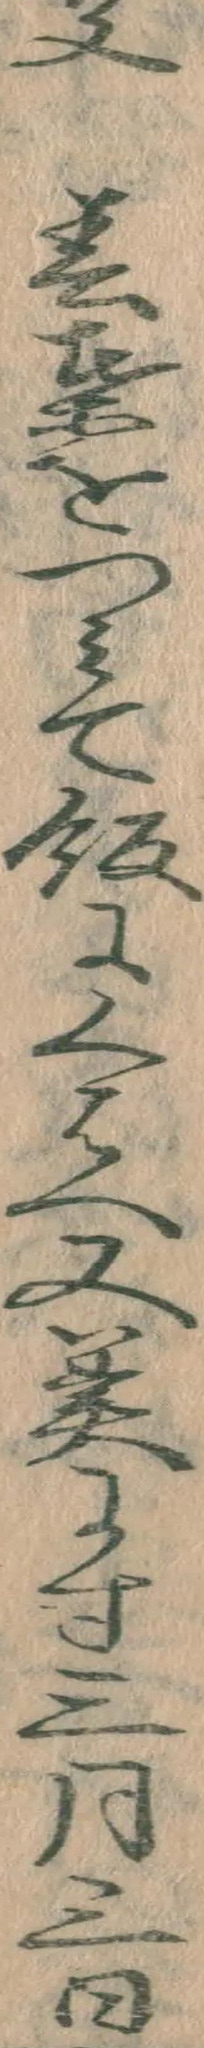艾春葉をつみて飯にくはへ又羹にす三月三日
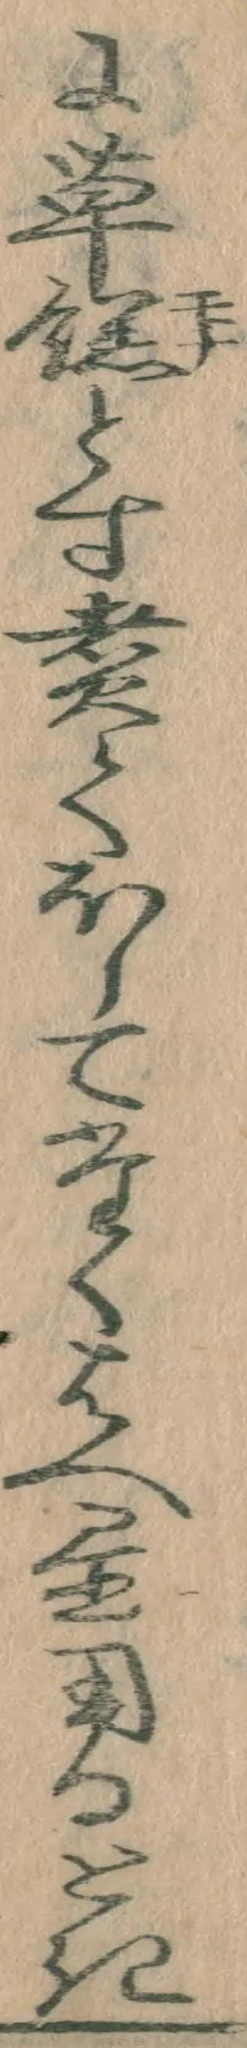に草餅とす煮てほしてたくはへ置用るとき
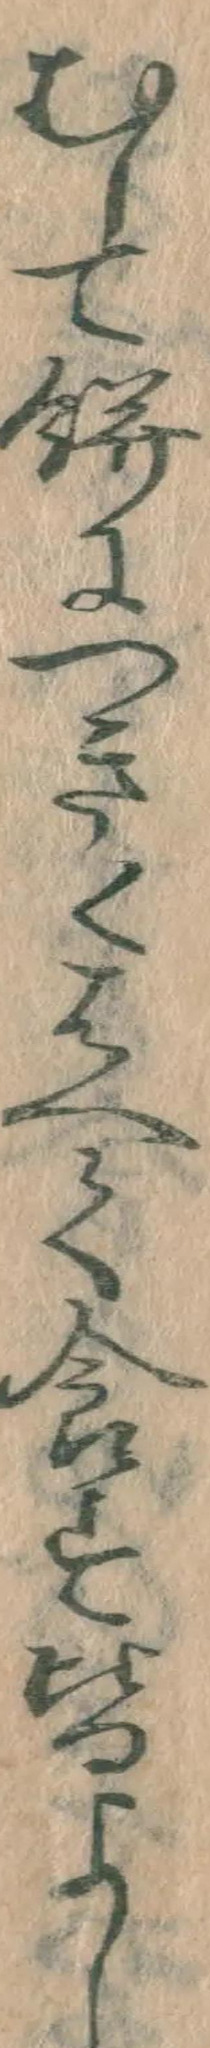むして餅につきくはへて食す皆よし
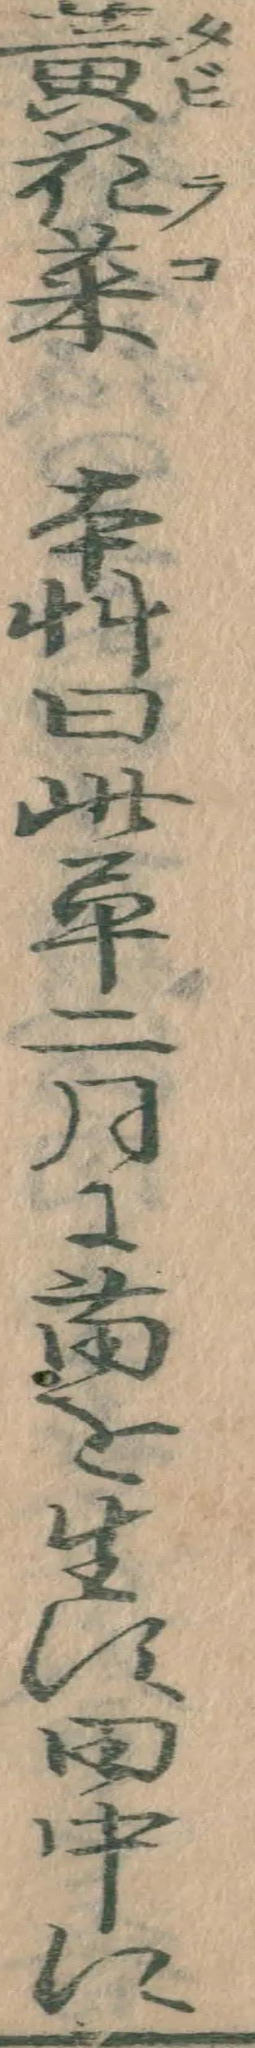黄花菜本艸曰此草二月に苗を生す田中に
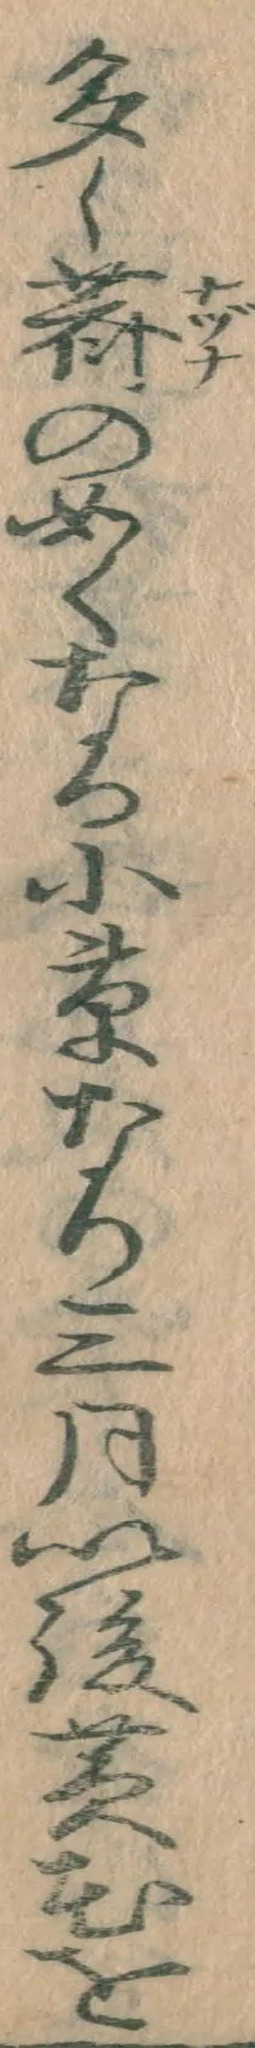多し薺(ナヅナ)の如くなる小草なり三月以後黄花を
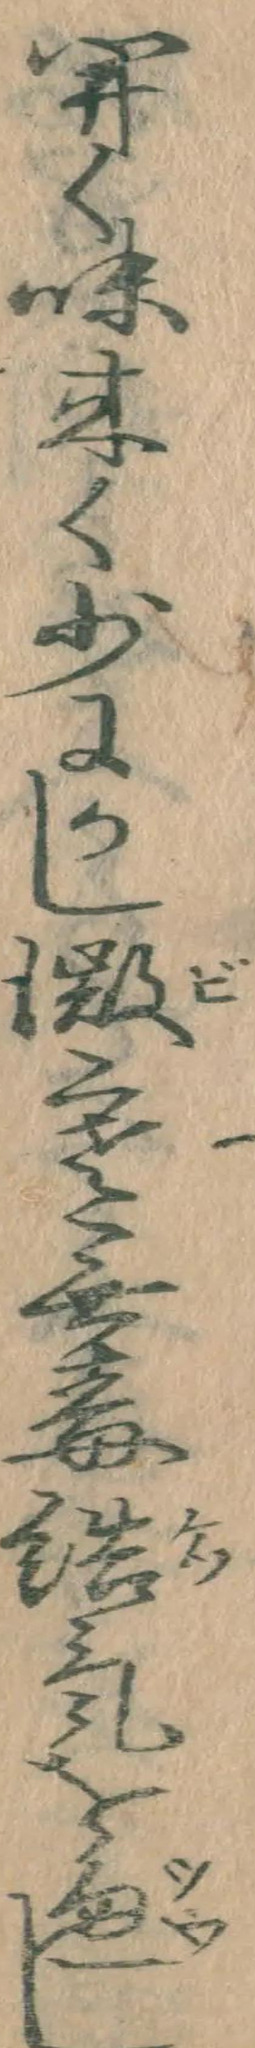開く味来く少にかし微寒無毒結気を通し

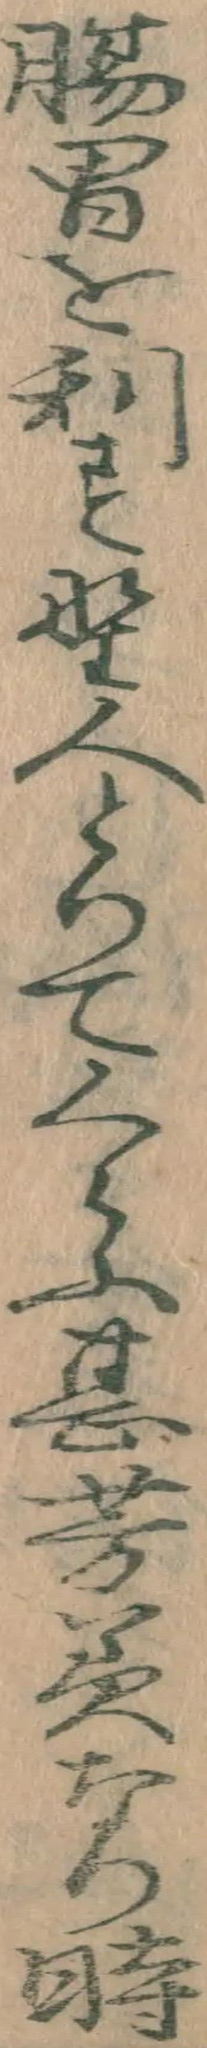腸胃を利す野人とりてくらふ甚だ芳美なり時
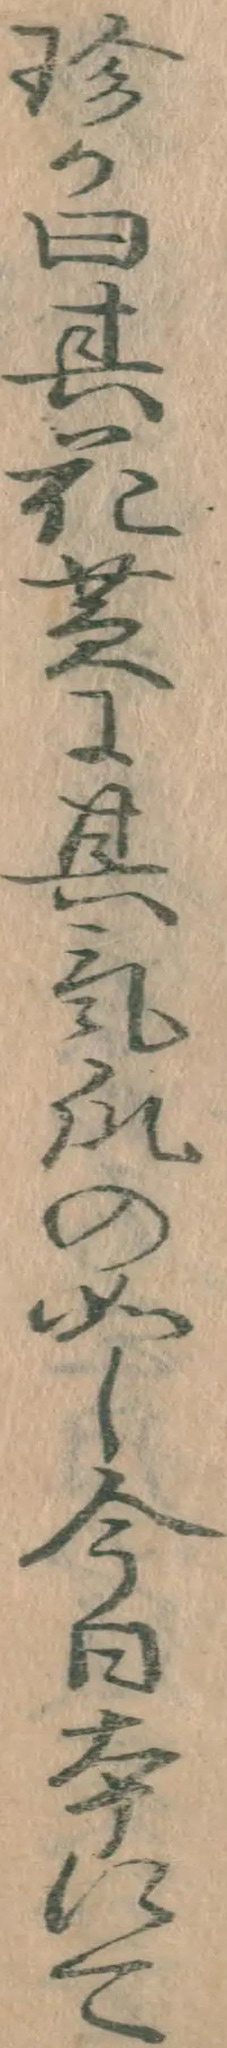珍か曰其花黄に其気瓜の如し今日本にて
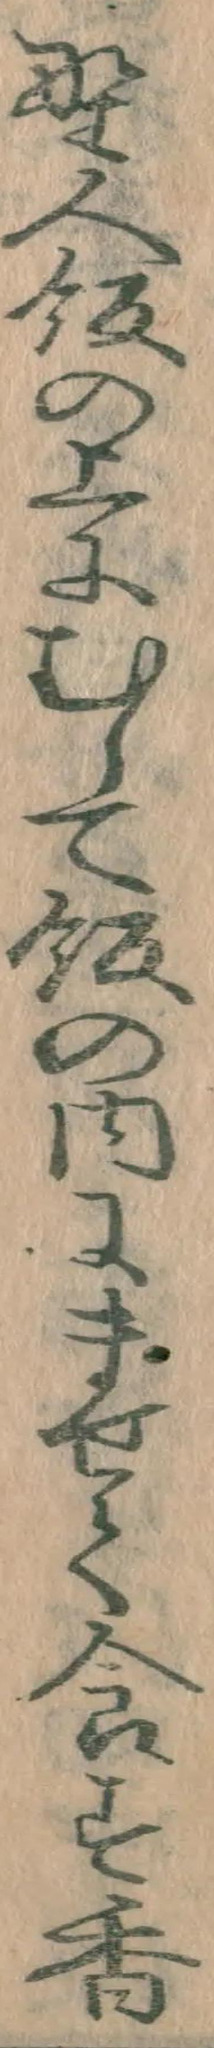野人飯の上にむして飯の内にませて食す香
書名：菜譜 3巻
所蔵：国立国会図書館 National Diet Library, JAPAN
